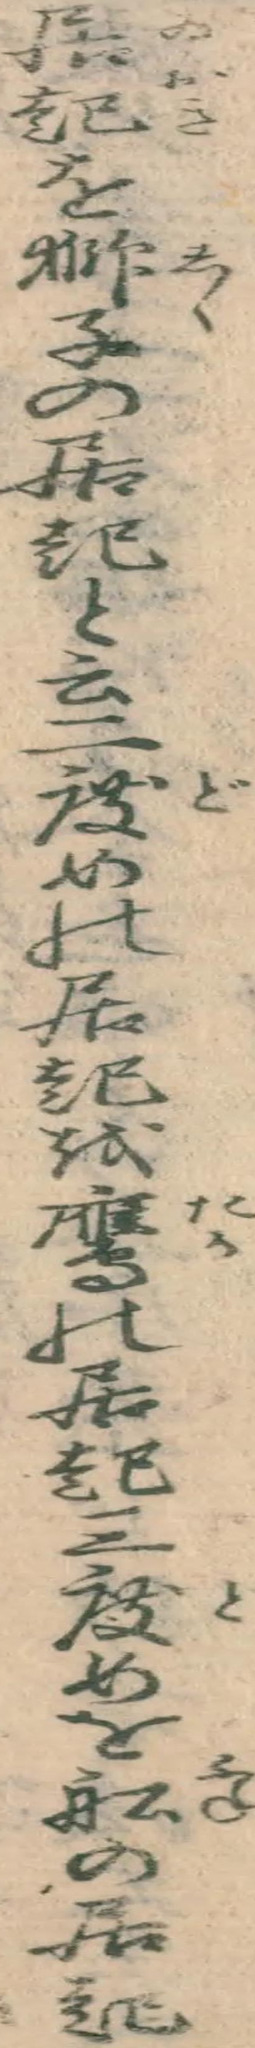居起を獅子の居起と云二度めの居起を鷹の居起三度めを船の居起
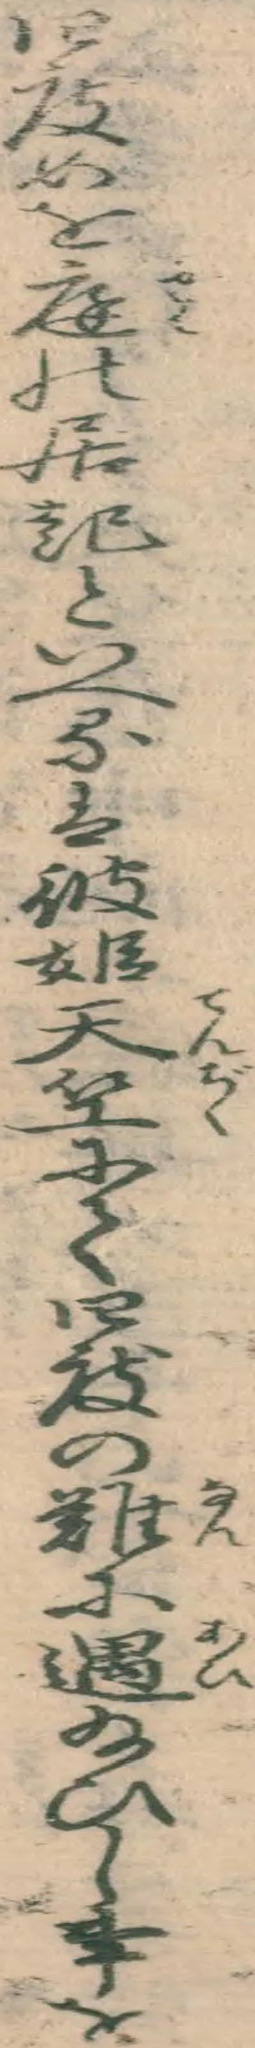四度めを庭の居起といへるは彼姫天竺にて四度の難に遇給ひし事を
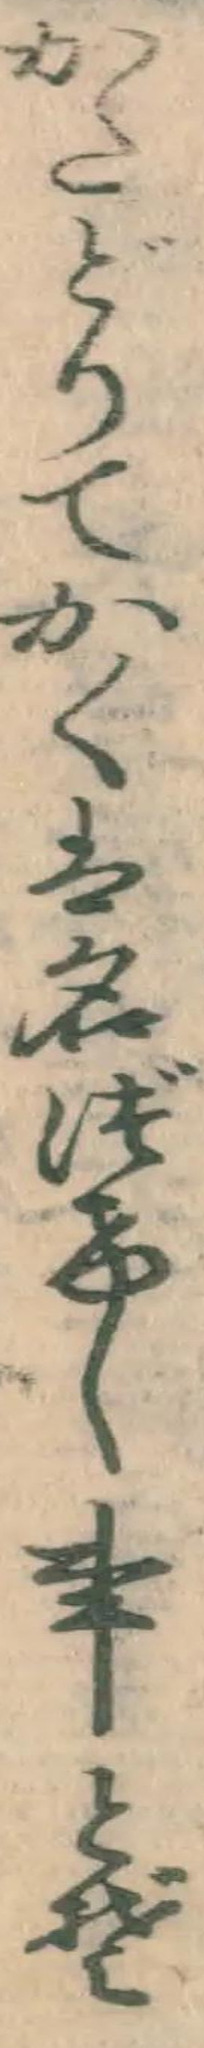かたどりてかくは名づけし事とぞ
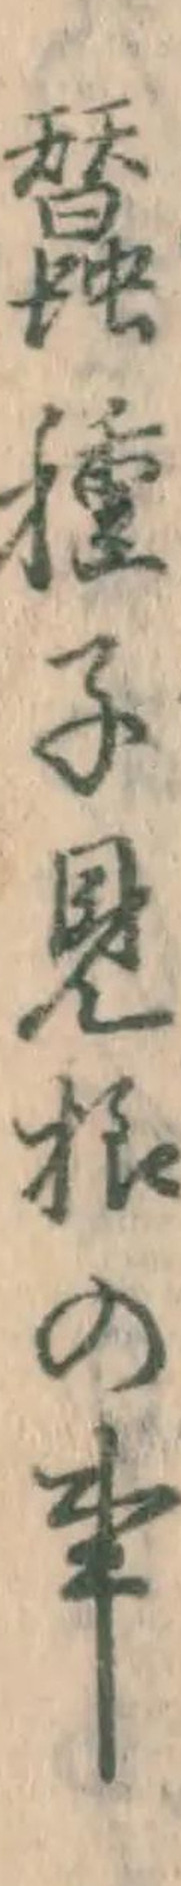蠶種子見様の事
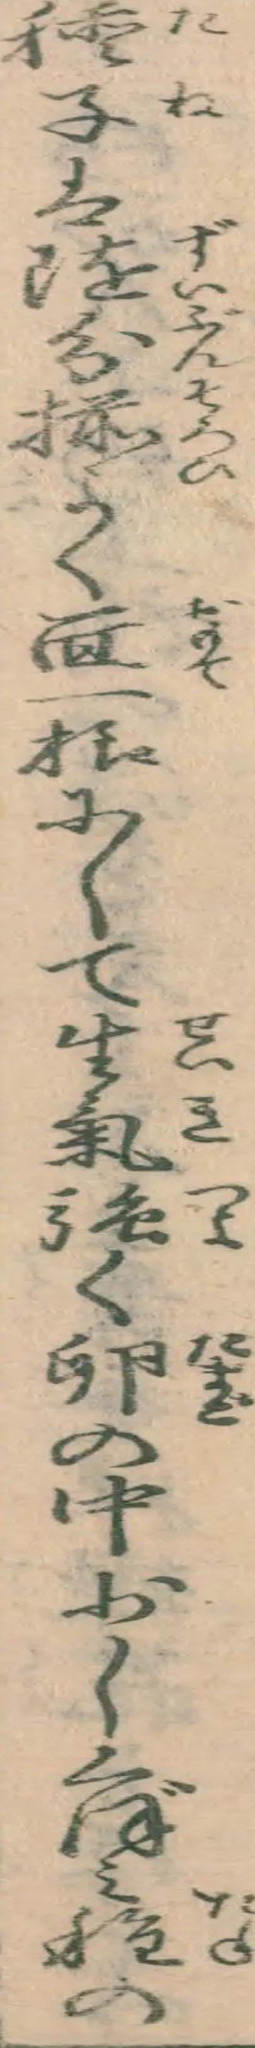種子は随分揃よく面一様にして生気強く卵の中少しくぼみ種の
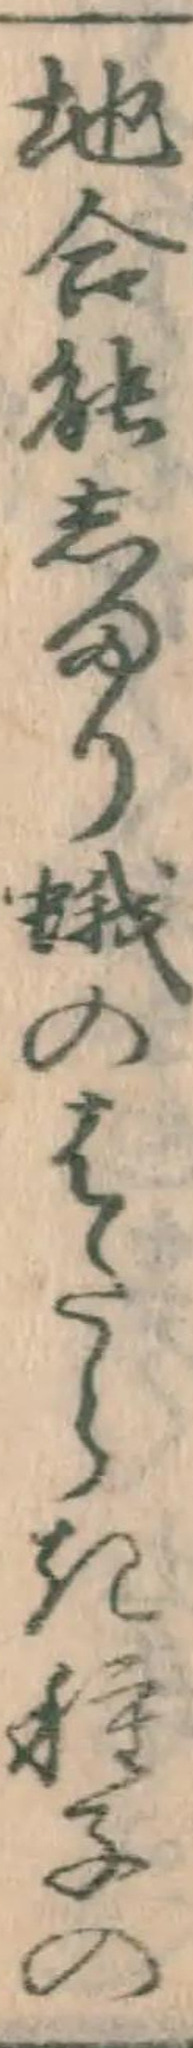地合能しまり蛾のはたらき種子の
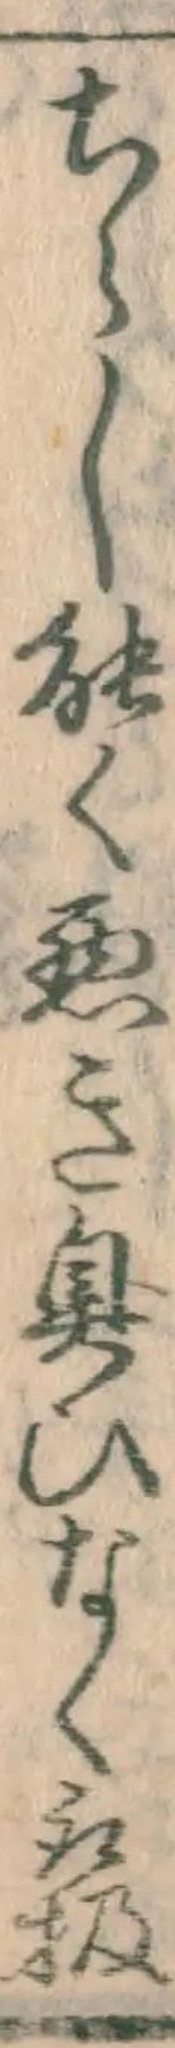ちらし能く悪き臭ひなく取扱
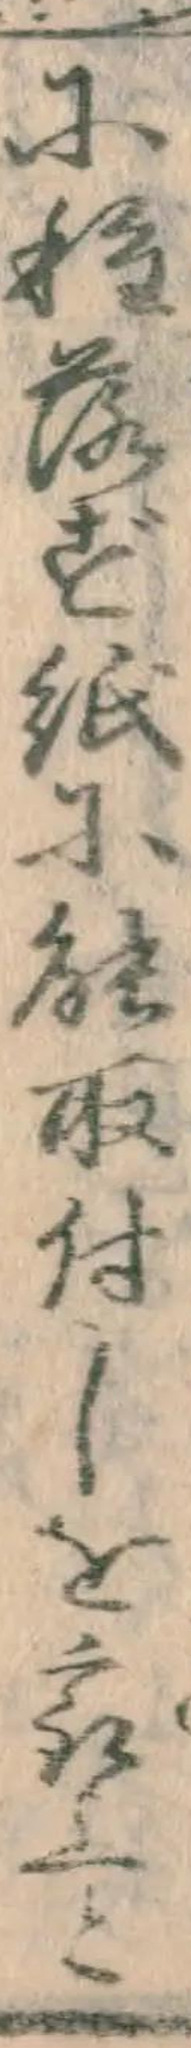に種落ず紙に能取付しを最上と
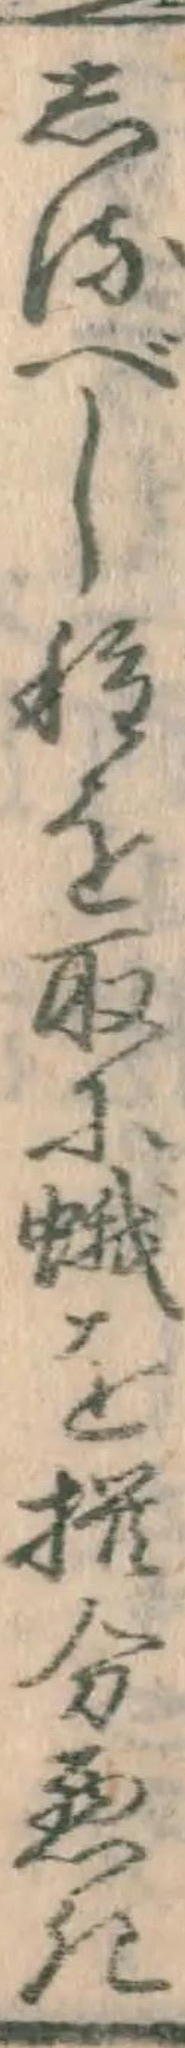しるべし種を取に娥を撰分悪き
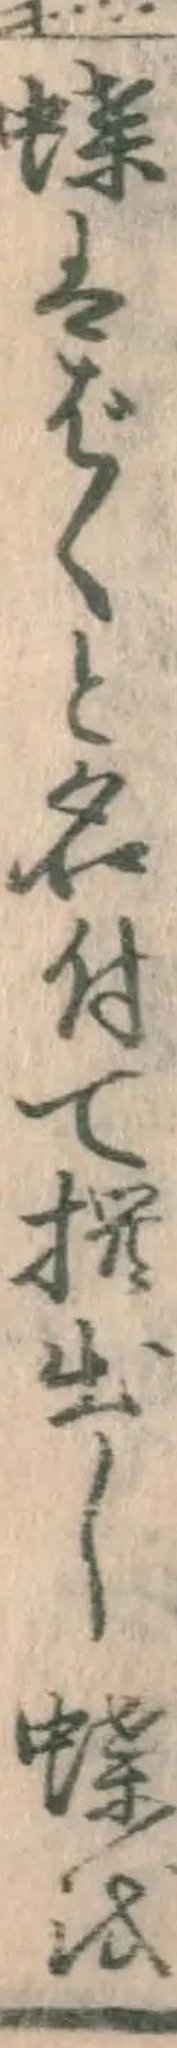蝶はばくと名付て撰出し蝶を
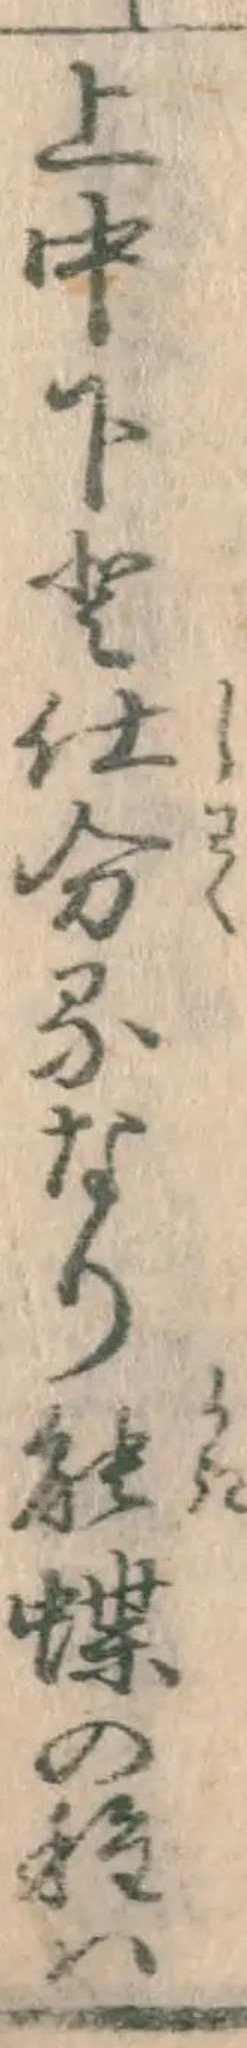上中下と仕分るなり能蝶の種は
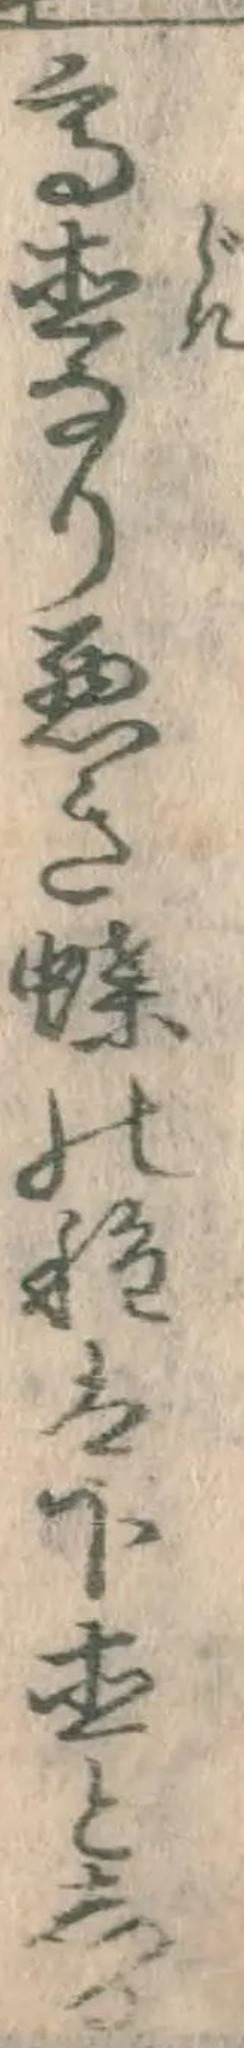高直なり悪き蝶の種は下直としる
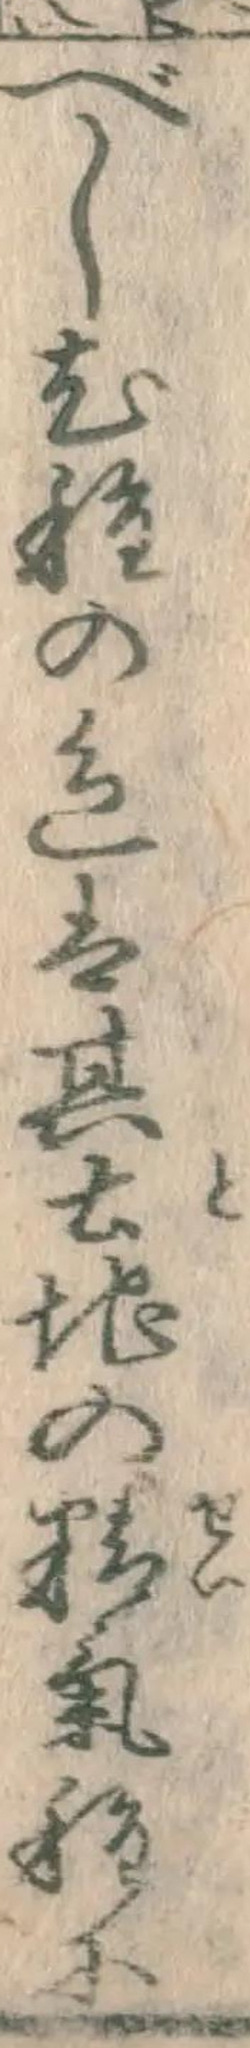べし尤種の色は其土地の精気種に
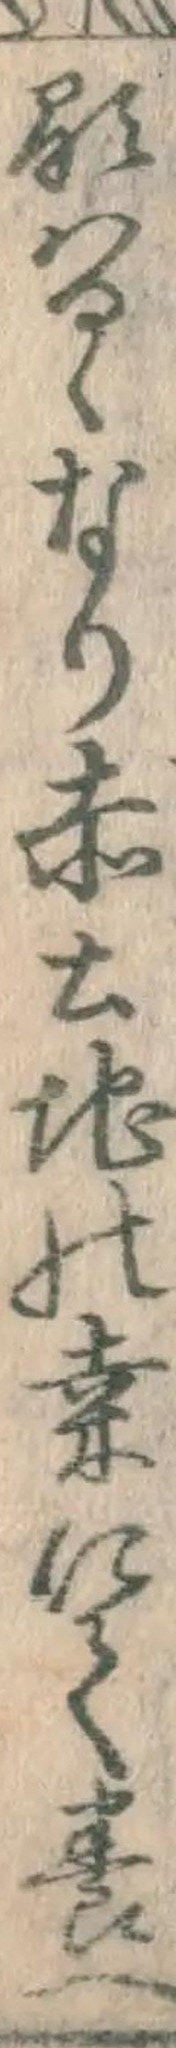顕はるゝなり赤土地の桑にて養へ
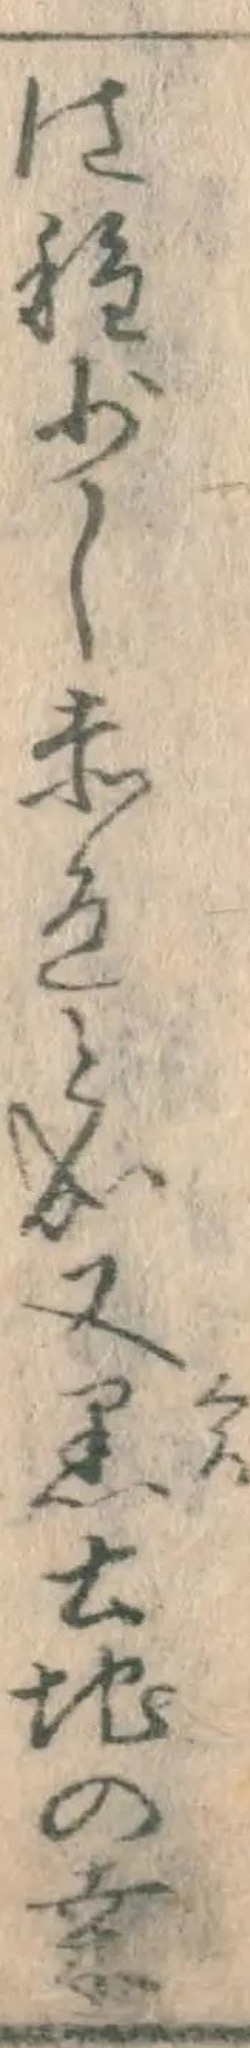は種少し赤色と成又黒土地の桑
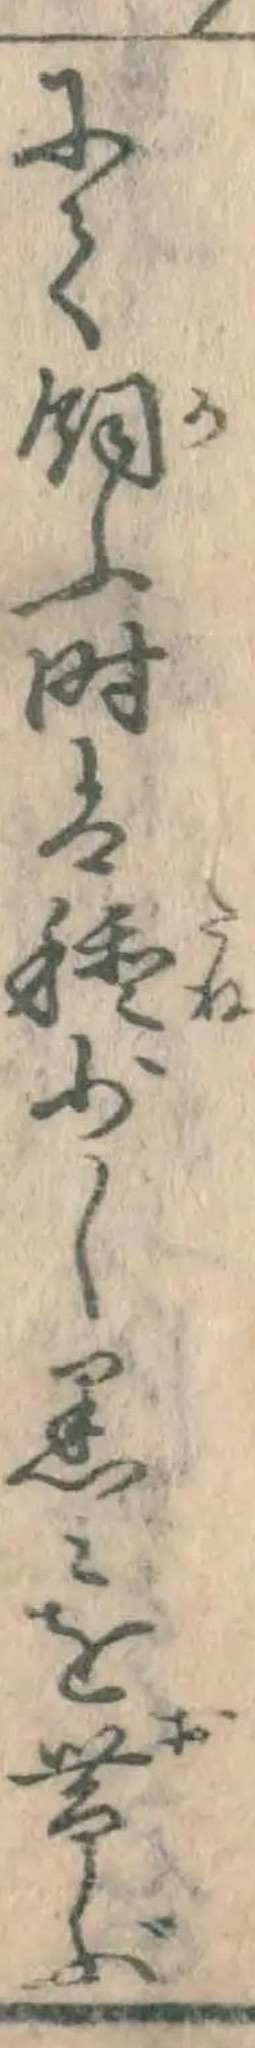にて飼ふ時は種少し黒みを帯ぶ
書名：養蚕秘録 3巻. [1]
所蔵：国立国会図書館 National Diet Library, JAPAN
